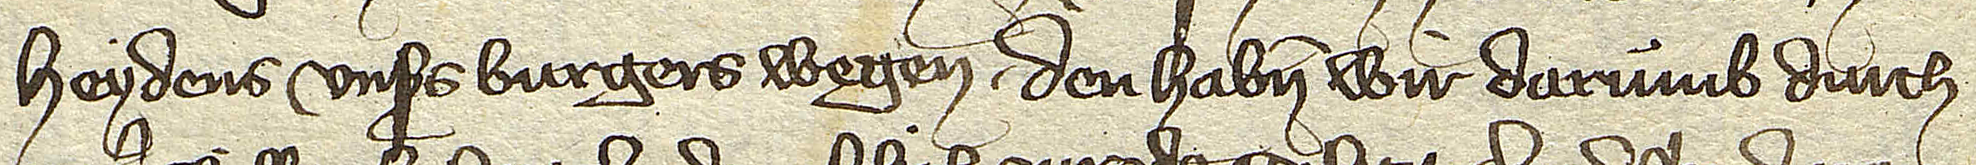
heydens vnſ*s burgers wegen / den habn* wir darümb durch
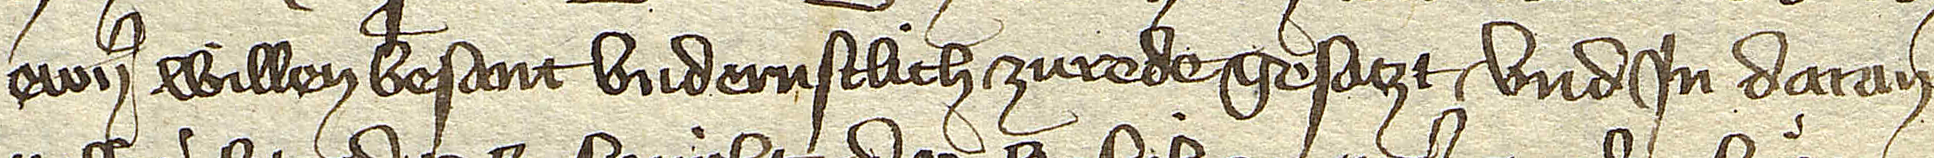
ewn* willen beſant vnd ernſtlich cʒurede geſacʒt / vnd In daran
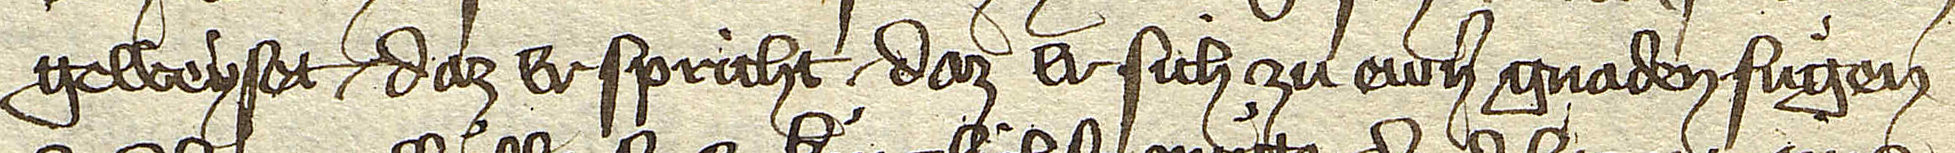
geweyſet / daʒ Er ſpricht / daʒ Er ſich cʒu ewn* gnaden fügen
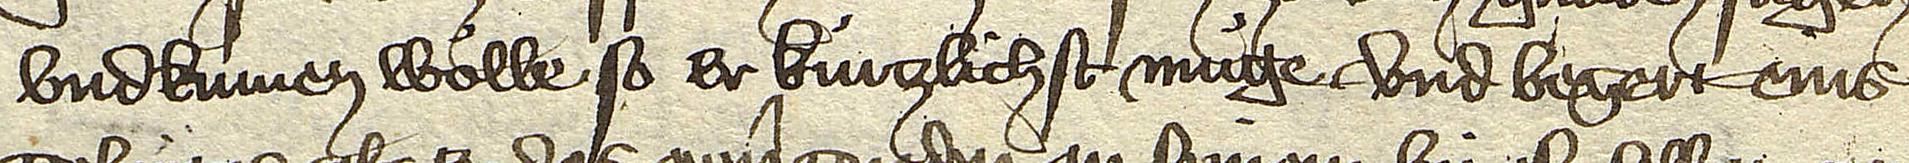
vnd kumen wölle ſo Er kürcʒlichſt müge / vnd begert eins
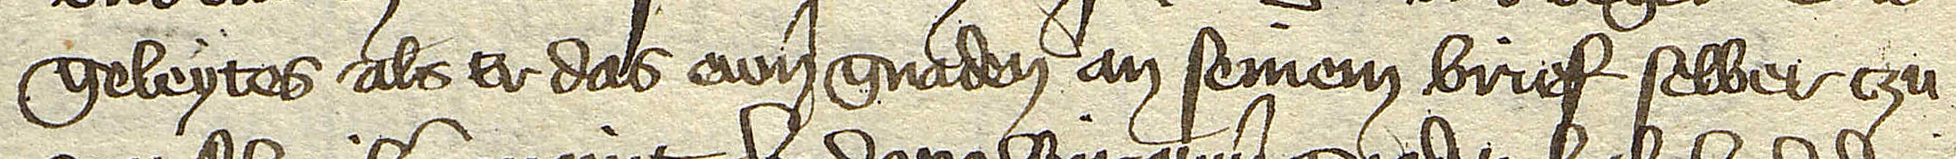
geleytes als Er das ewn* gnaden an ſeinem brief ſelber cʒu
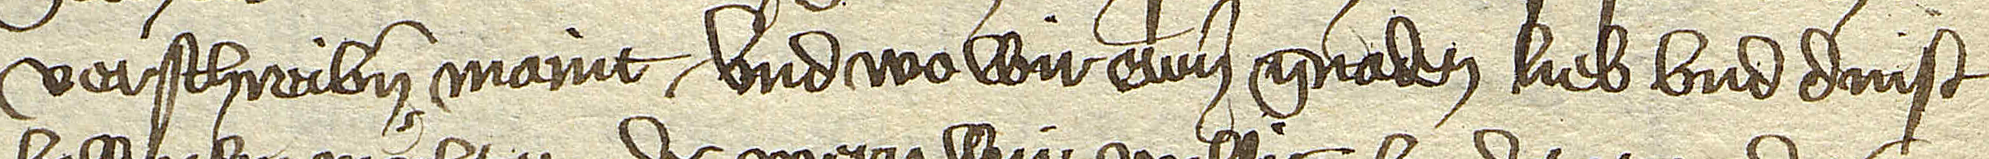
verſchreibn* maint / vnd wo wir ewn* gnaden lieb vnd dinſt
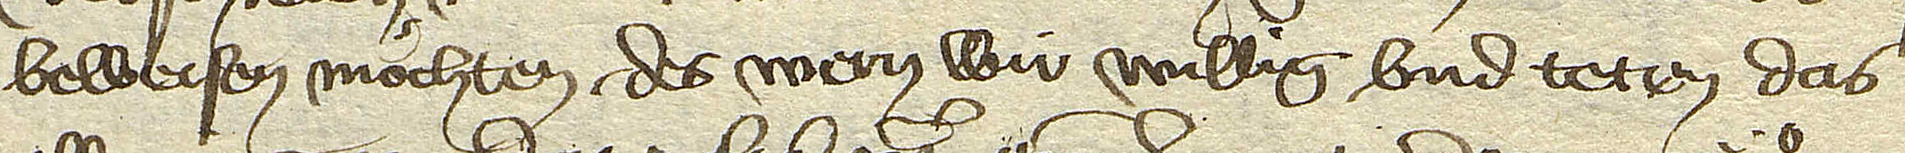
beweiſen möchten / des wern wir willig vnd teten das
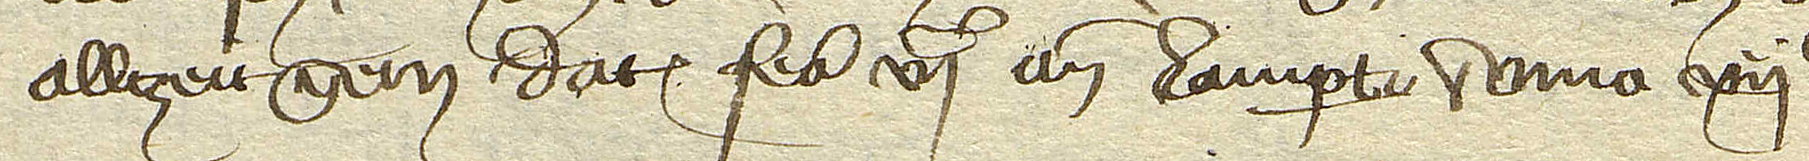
allcʒeit gern / dat* fea* vi* an* Lamp*ti Anno xii*
